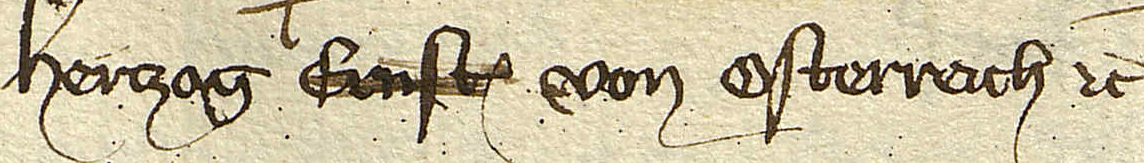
hercʒog Ernſt* von Oſterreich ec*
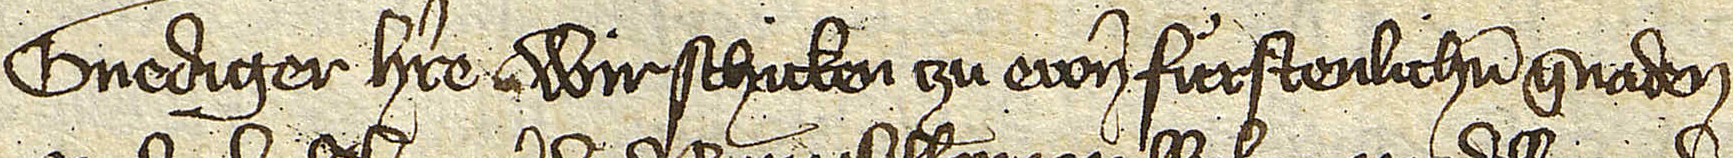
Gnediger h*re / Wir ſchicken cʒu ewn* fürſtenlichn* gnaden
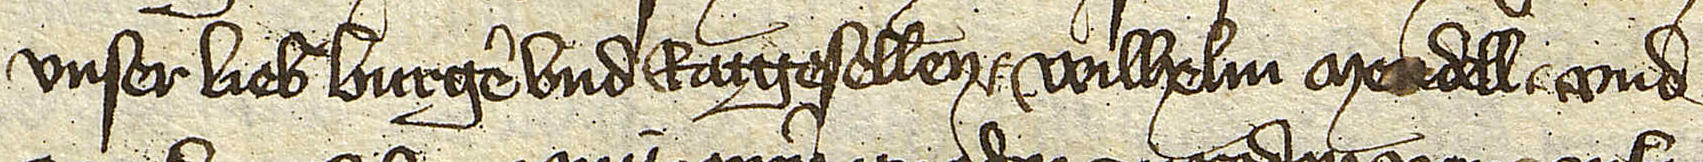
vnſer lieb burge* vnd Ratgeſellen / wilhelm Mendell / vnd
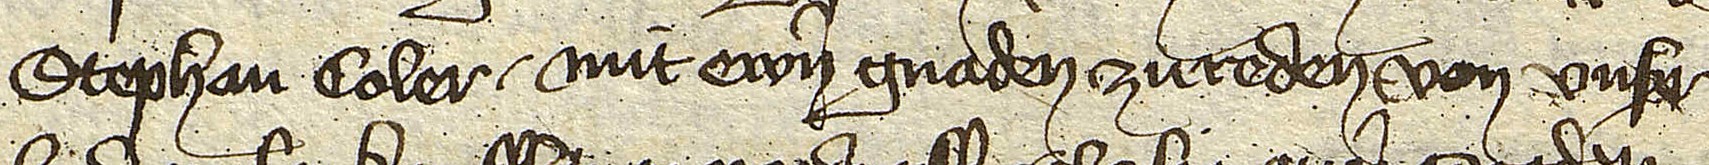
Stephan Coler / mit ewn* gnaden cʒu reden von vnſ*r
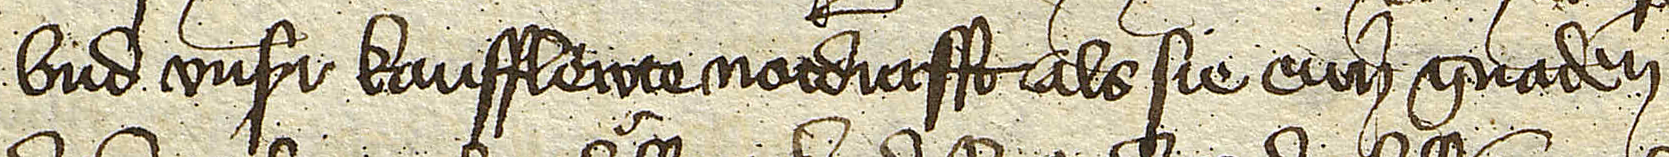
vnd vnſ*r kaufflewte notdurfft / als ſie ewn* gnaden
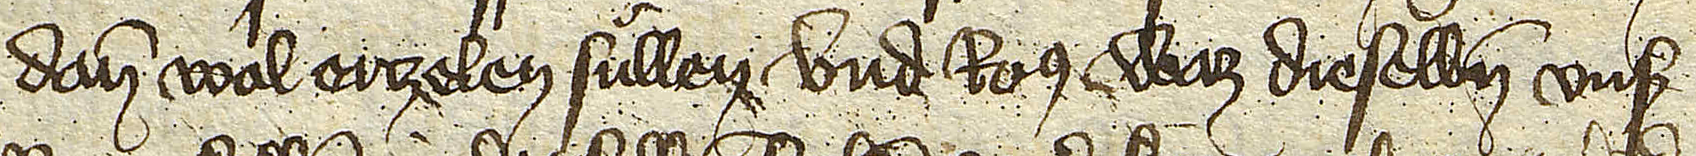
dan* wol ercʒelen ſüllen / vnd Ro* / waʒ dieſelbn* vnſ*
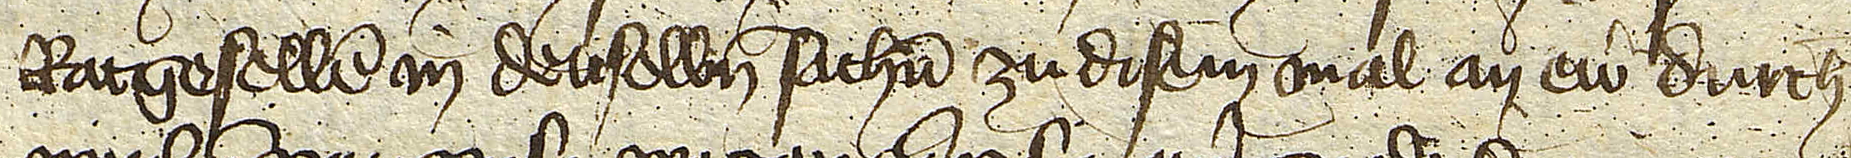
Ratgeſelle* in denſelbn* ſachn* cʒu diſem mal an ew* durch*
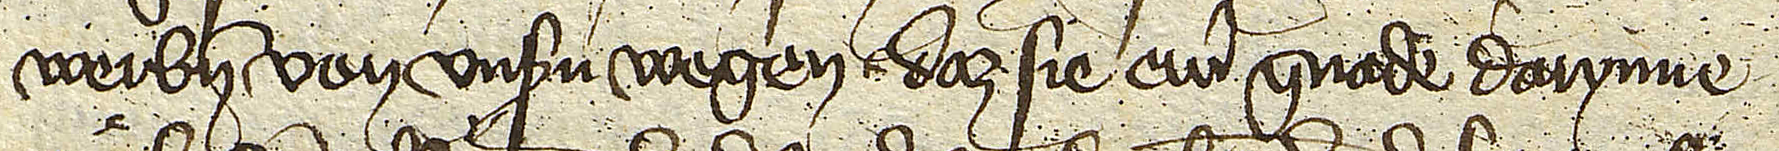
werbn* von vnſ*n wegen / daʒ ſie ew* gnade darynne
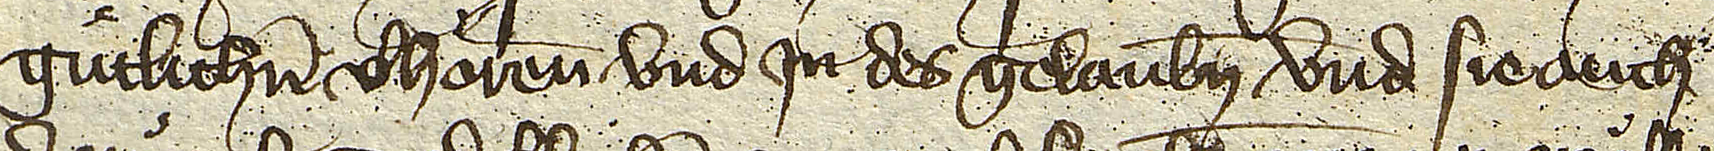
gütlichn* v*hören / vnd In des gelaubn* / vnd ſie auch
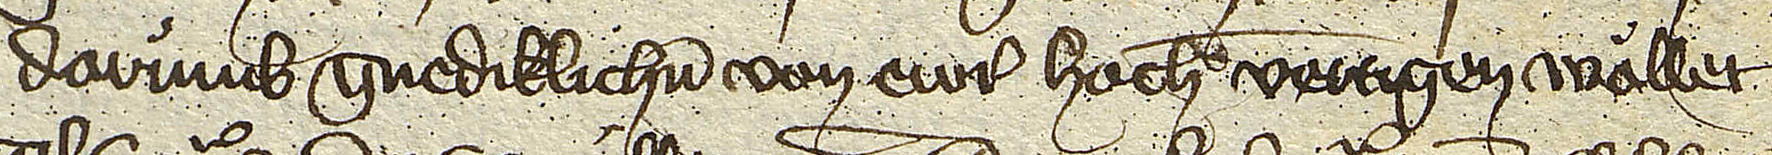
darümb gnediklichn* von ewr* hoch* vertigen wöllet
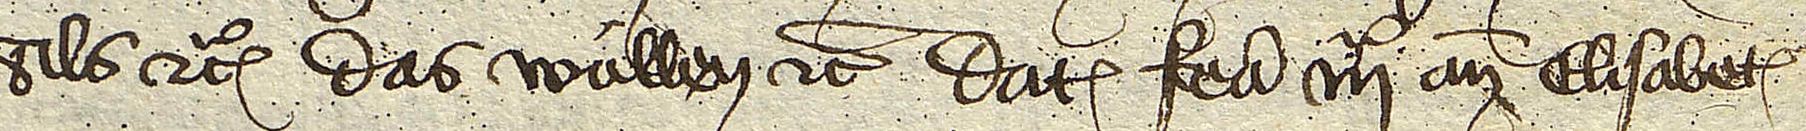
Als ec* das wöllen ec* dat* fea* iii* an* Eliſabet*
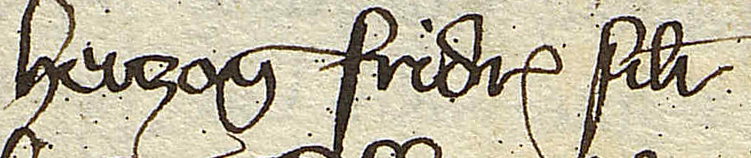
hercʒog fridr* ſilr*
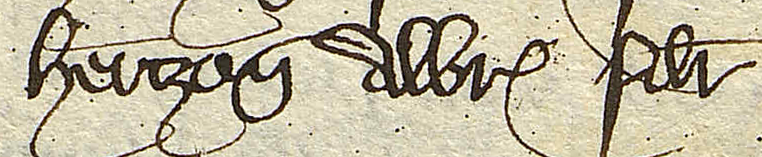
hercʒog Albr* ſilr*
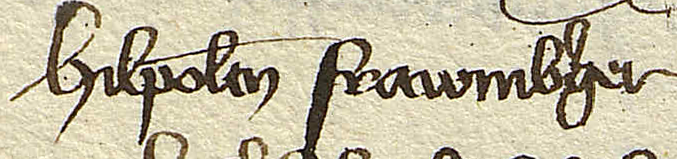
hilpoltn* frawmb*ger
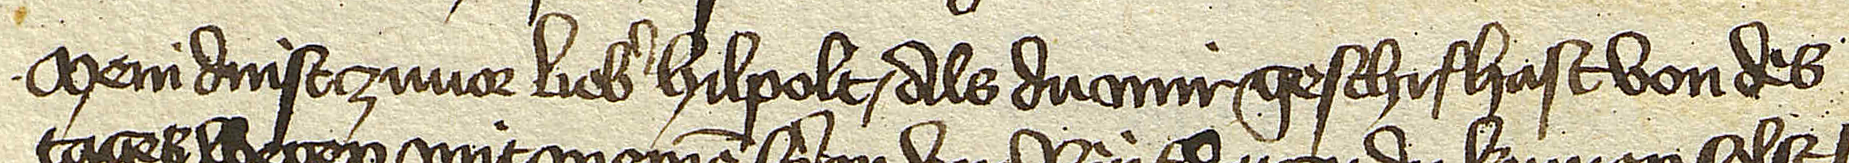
Mein dinſte cʒuuor lieb* hilpolt / Als du mir geſchr* haſt von des
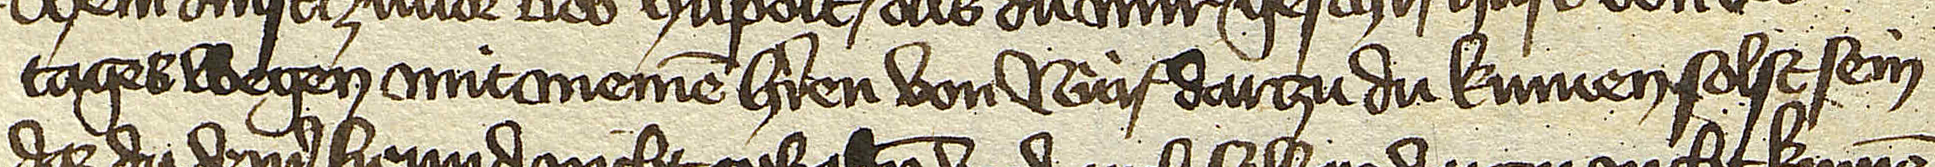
tages wegen mit meine* hr*en von Nür* darcʒu du kumen ſolſt ſein
